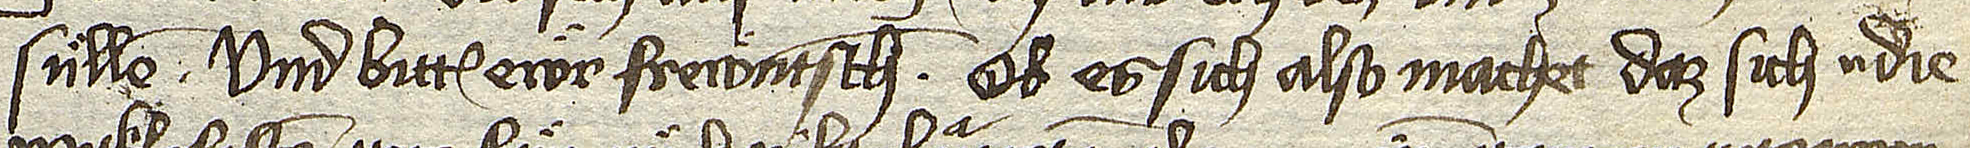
ſülle* . Vnd bitt* eẅr freẅntſch* . Ob es ſich alſo machet daʒ ſich ~ die
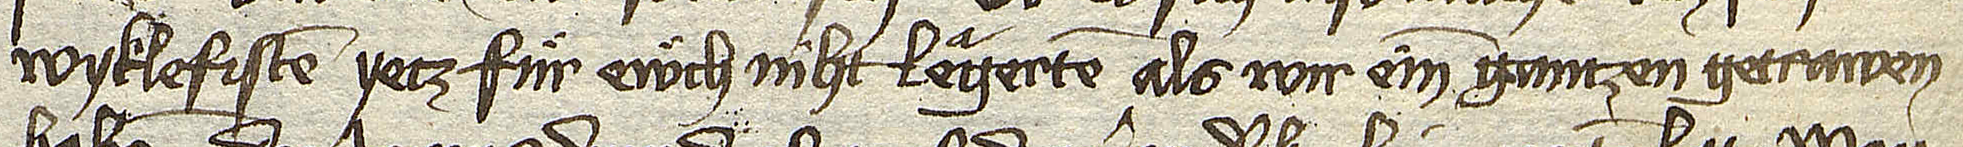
wyklefiſte* yecʒ für eẅch niht lëgerte als wir ein* gancʒen getrawen
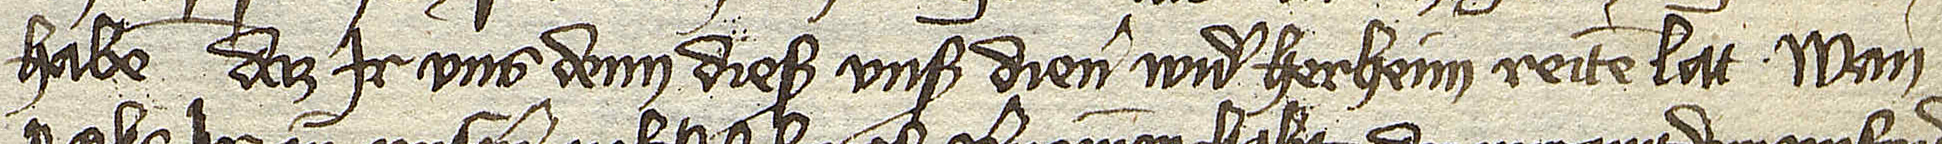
habe* daʒ Ir vns denn dieſʒ vnſ* dien* wid* herheim reite* lat . Wan
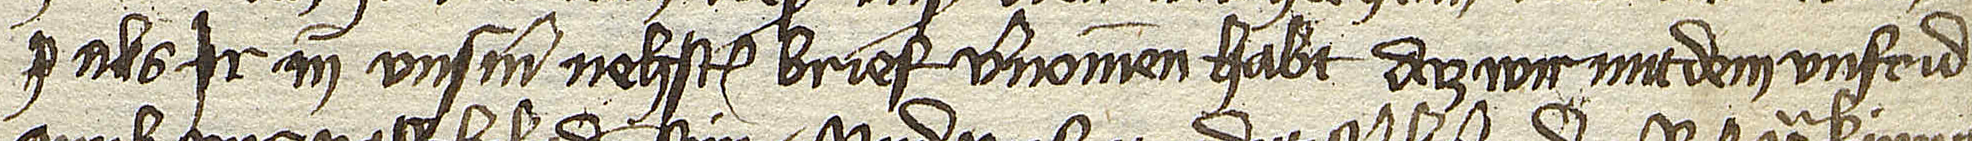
I als Ir in vnſm* nehſt* brief v*nomen* habt daʒ wir mit dem vnfrid
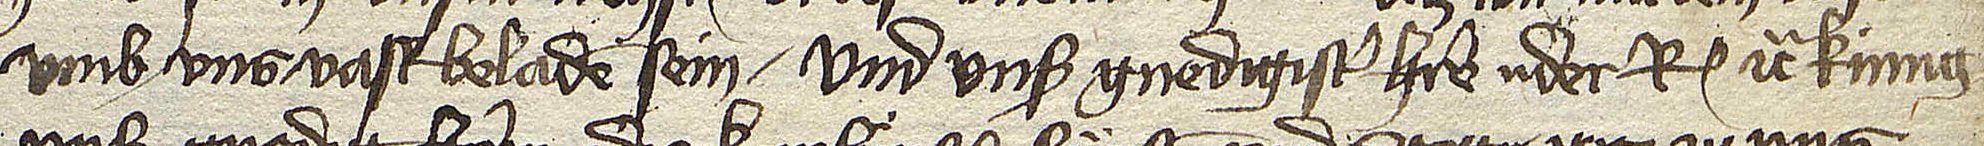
vmb vns vaſt belade* ſein / Vnd vnſ* gnedigiſt* hr*e ~ der R* ec* künig
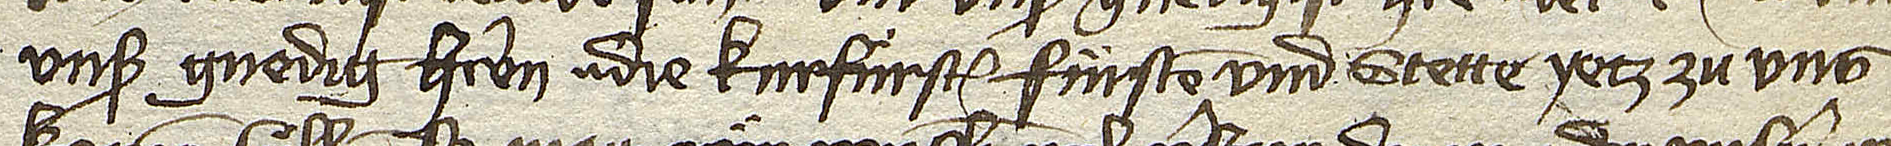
vnſ* gnedig hr*en ~ die kurfürſt* fürſte* vnd Stette yecʒ ʒu vns
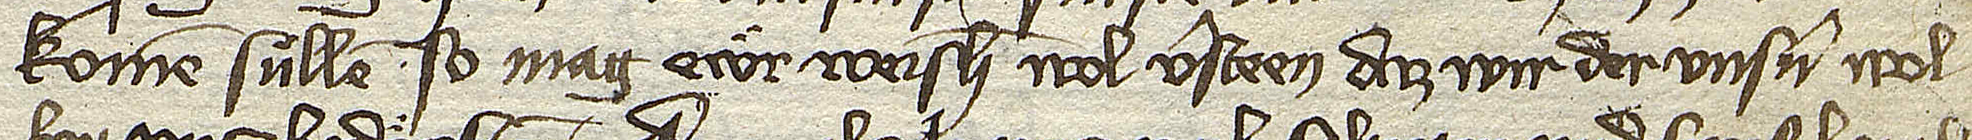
kome* ſülle* . ſo mag eẅr weiſh* wol v*ſteen daʒ wir der vnſn* wol
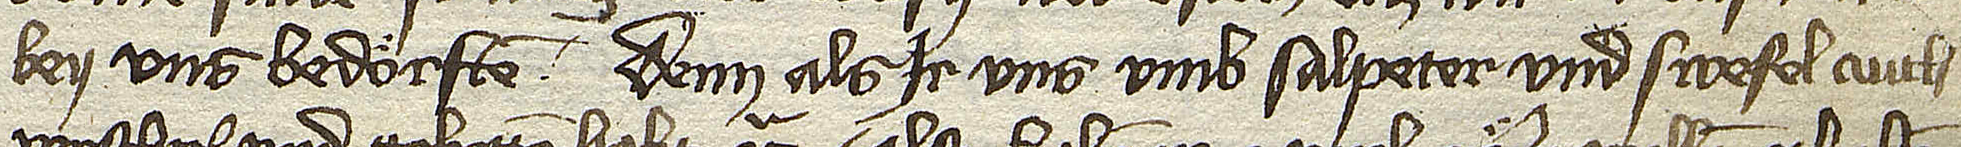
bey vns bedörfte* / Denn als Ir vns vmb ſalpeter vnd ſwefel auch
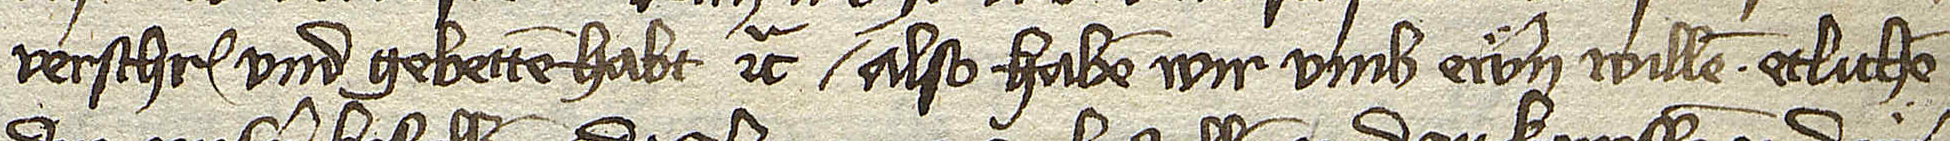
verſchr* vnd gebette* habt ec* / alſo habe* wir vmb eẅn* wille* etliche*
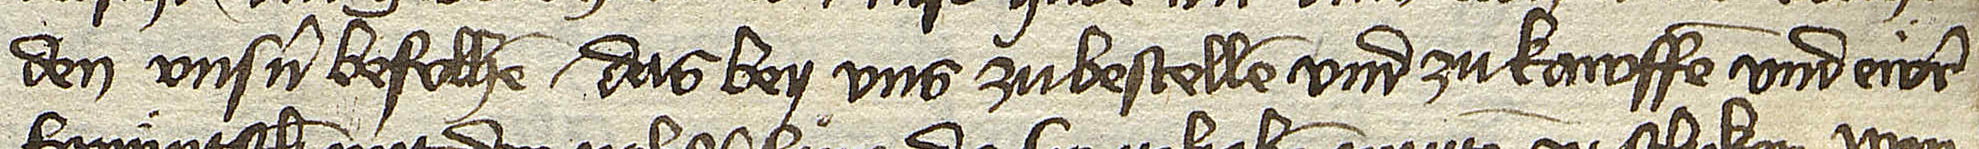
den vnſn* befolhe* / das bey vns ʒu beſtelle* vnd ʒu kawffe* vnd eẅr*
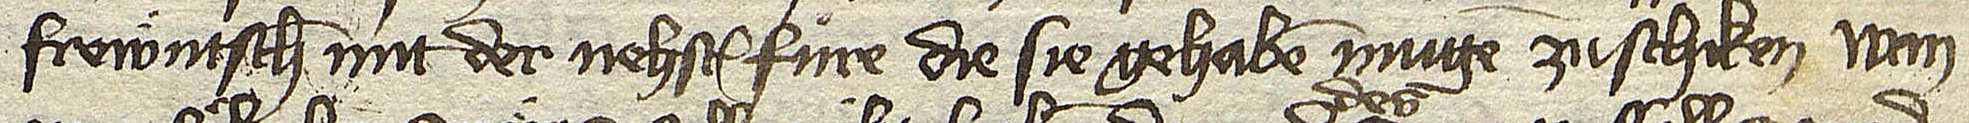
freẅntſch* mit der nehſt* fure die ſie gehabe* muge* ʒu ſchiken wan
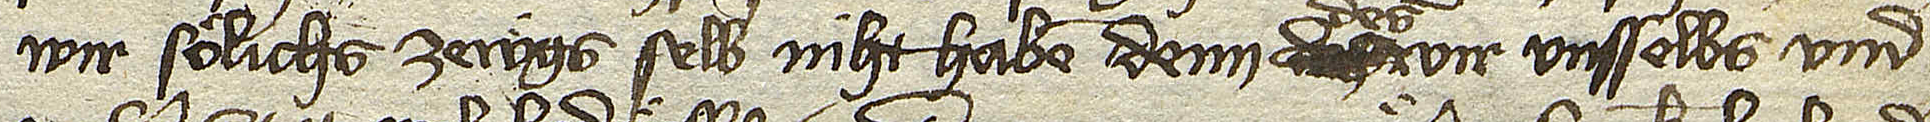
wir ſölichs ʒeẅgs ſelb niht habe* / denn das wir vnſſelbs vnd
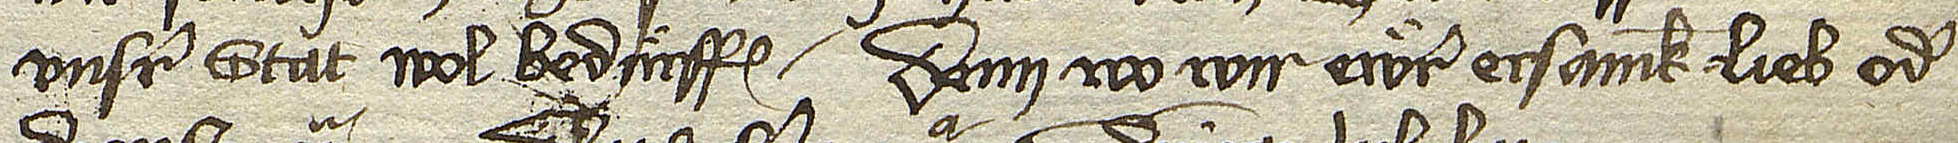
vnſr* Stat wol bedürff* / Denn wo wir eẅr* erſamk* lieb od*
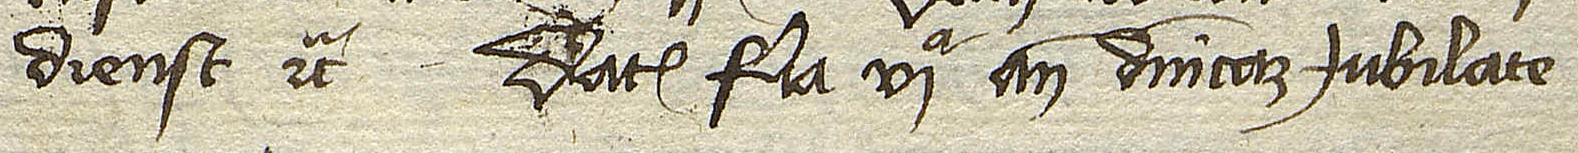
dienſt ec* Dat* fia* vi* an* dinca* Iubilate
